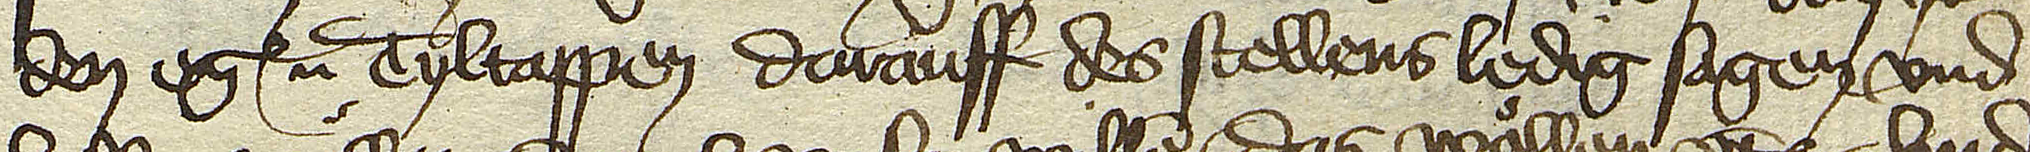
den eg* ~ Tyltappen darauff des ſtellens ledig ſagen vnd
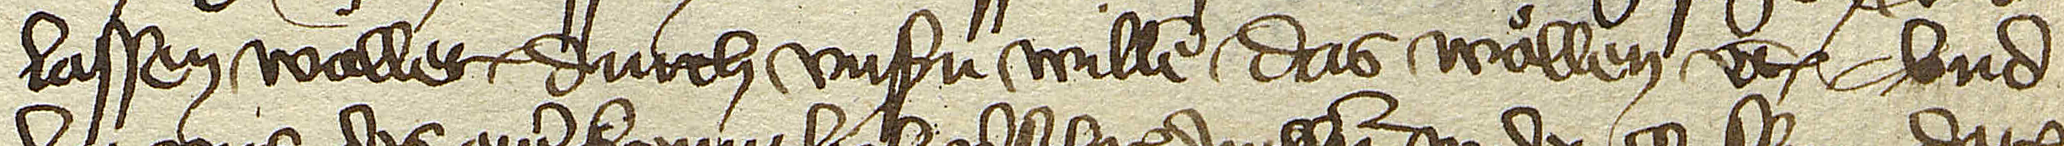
laſſen wöllet / durch vnſ*n wille* / das wöllen ec* / vnd
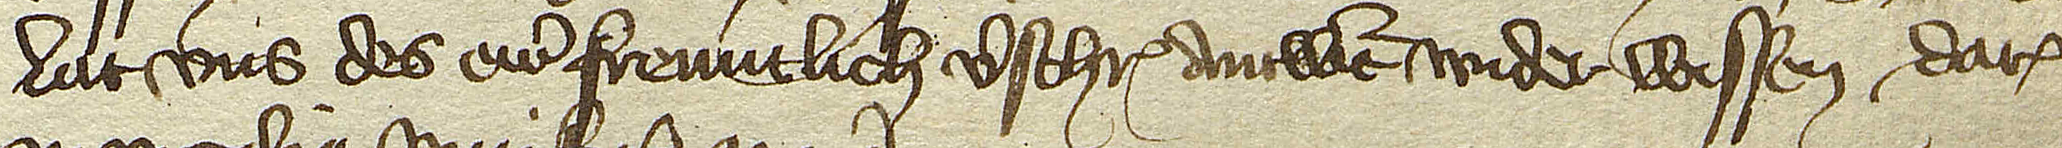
lat vns des ew* freuntlich v*ſchr* Antwt* wider wiſſen / dar*
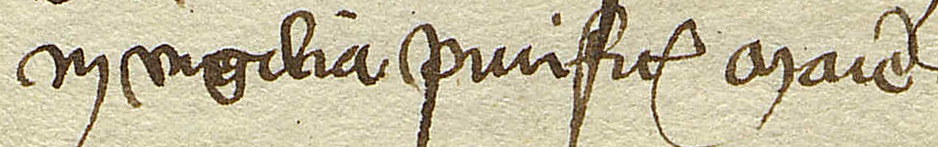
in vigilia purific* Maie*
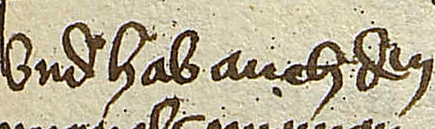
vnd hab auch den
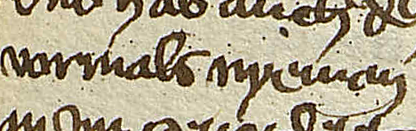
vormals nyeman
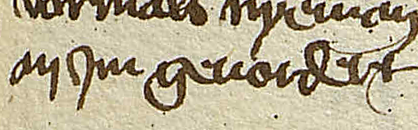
an Im geuordert
